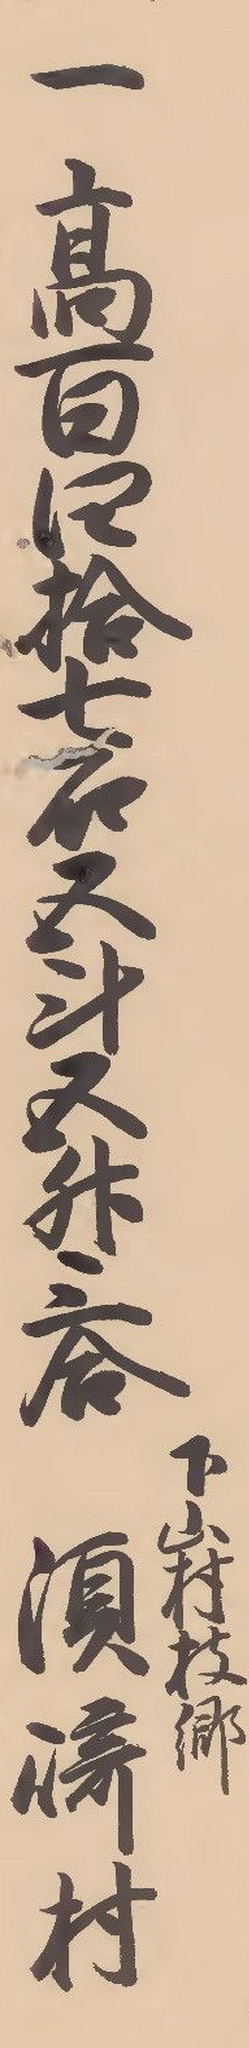一髙百四拾七石五斗五升三合須崎村

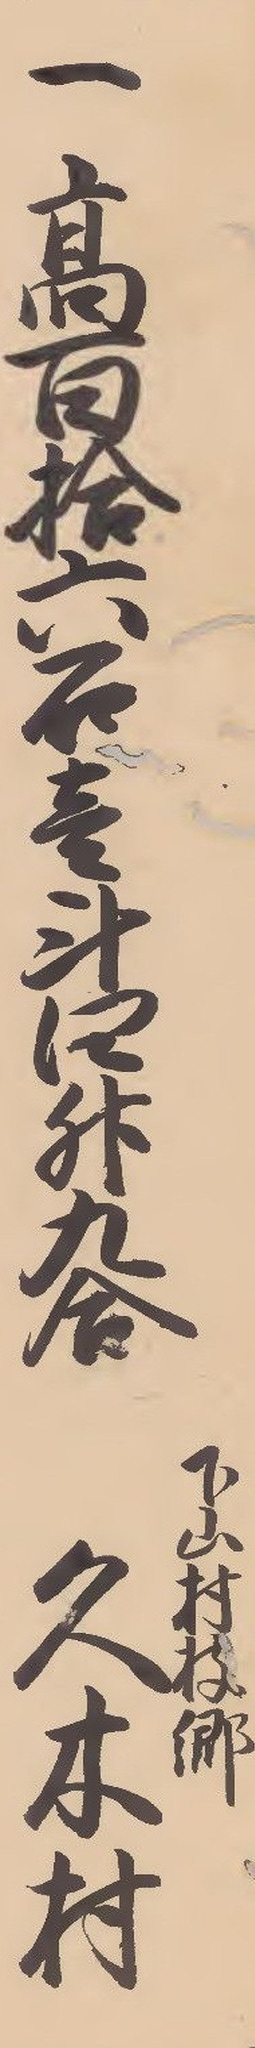一髙百拾六石壱斗四升九合久木村
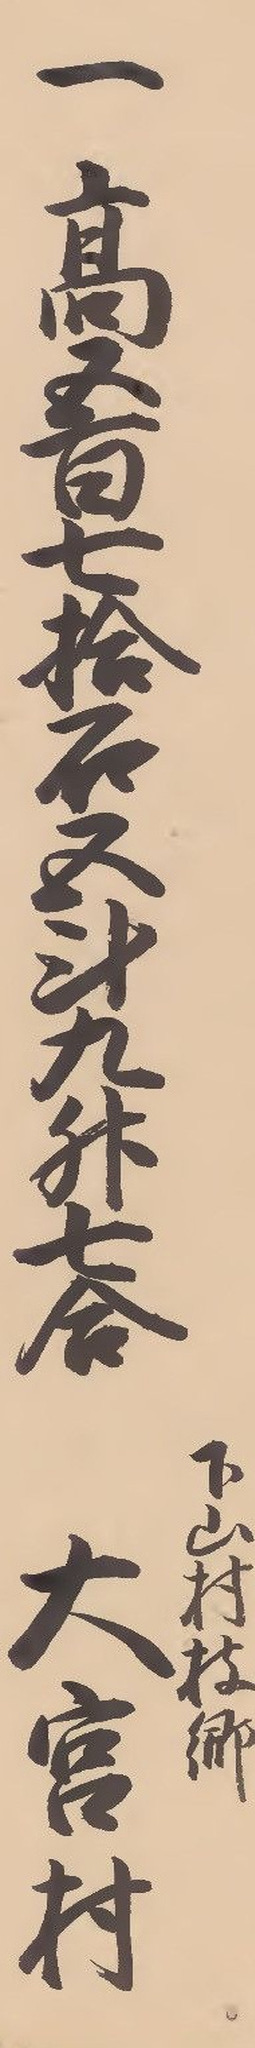一髙五百七拾石五斗九升七合大宮村
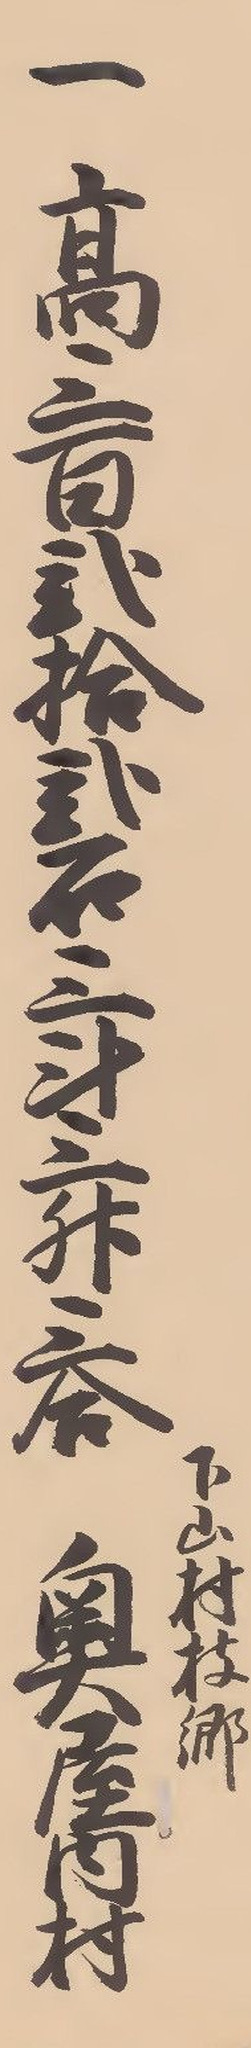一髙三百弐拾弐石三斗三升三合奥屋内村
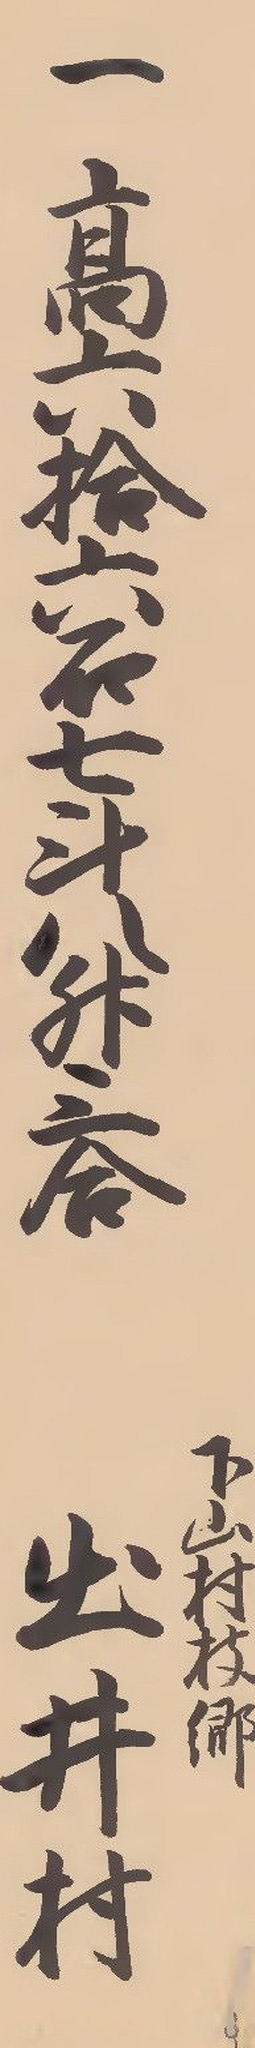一髙六拾六石七斗八升三合出井村
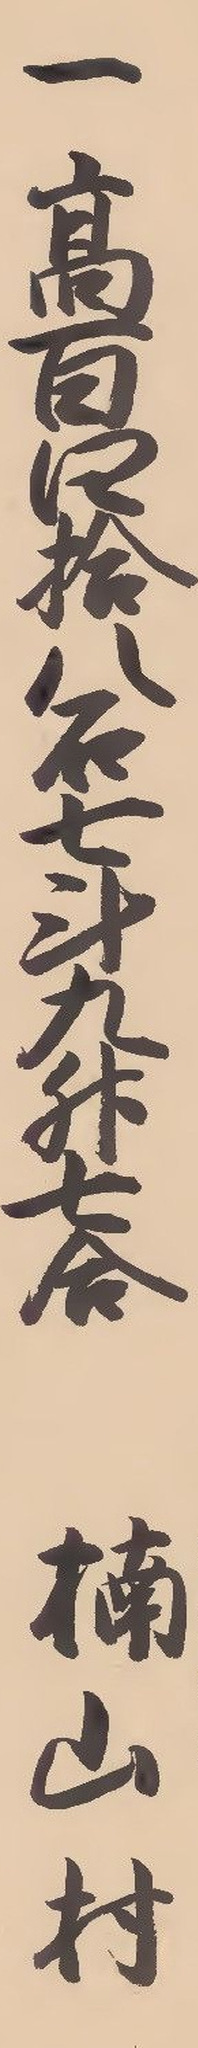一髙百四拾八石七斗九升七合楠山村
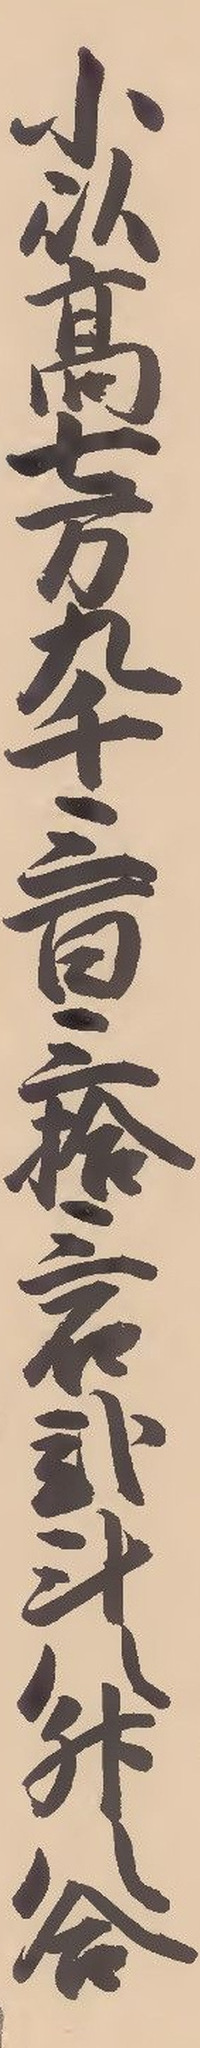小以髙七万九千三百三拾三石弐斗八升八合
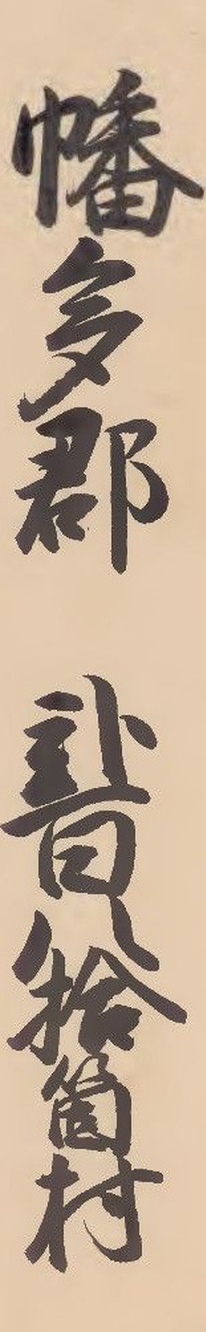幡多郡弐百八拾箇村
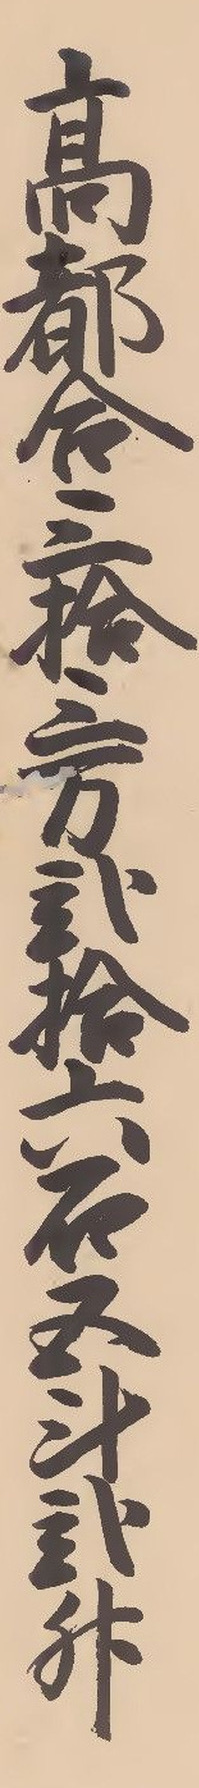髙都合三拾三万弐拾六石五斗弐升

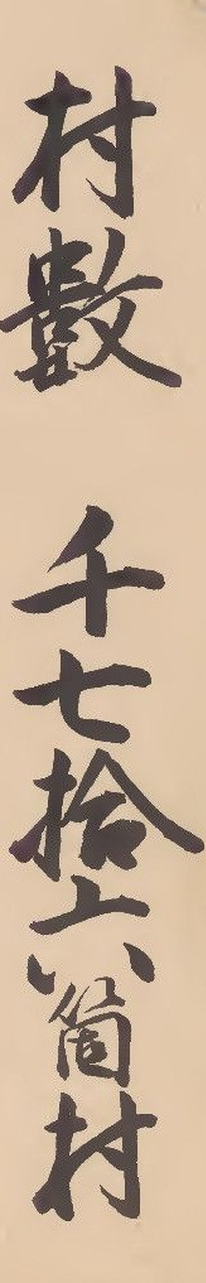村數千七拾六箇村
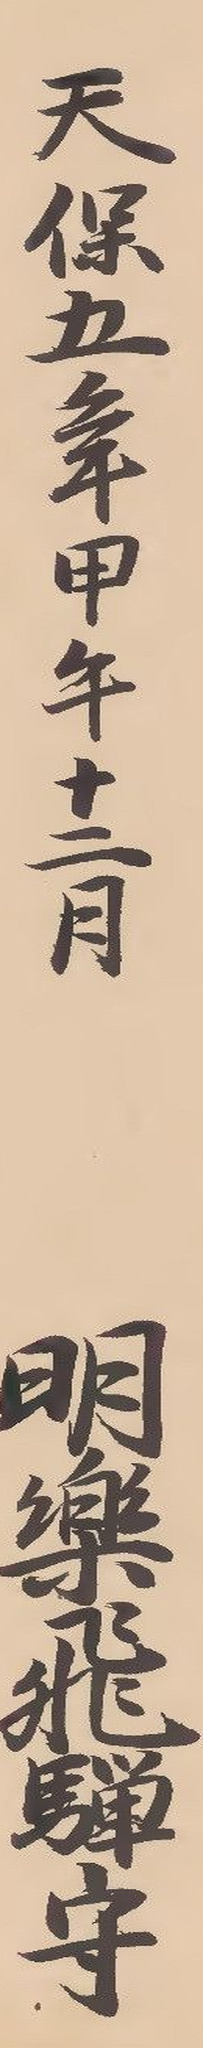天保五年甲午十二月明樂飛騨守
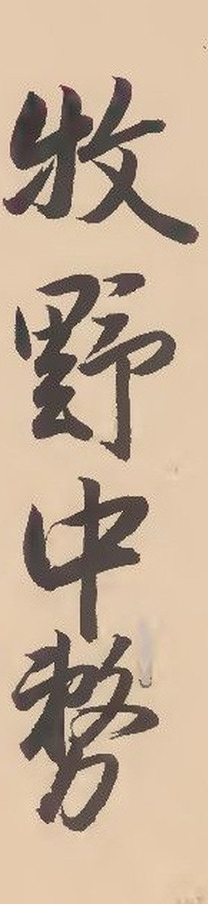牧野中務
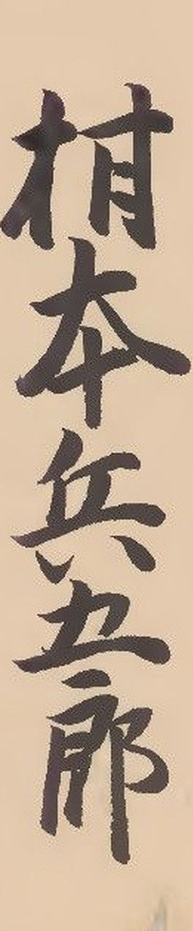柑本兵五郎
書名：土佐国郷帳
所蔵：国立公文書館 National Archives of Japan
